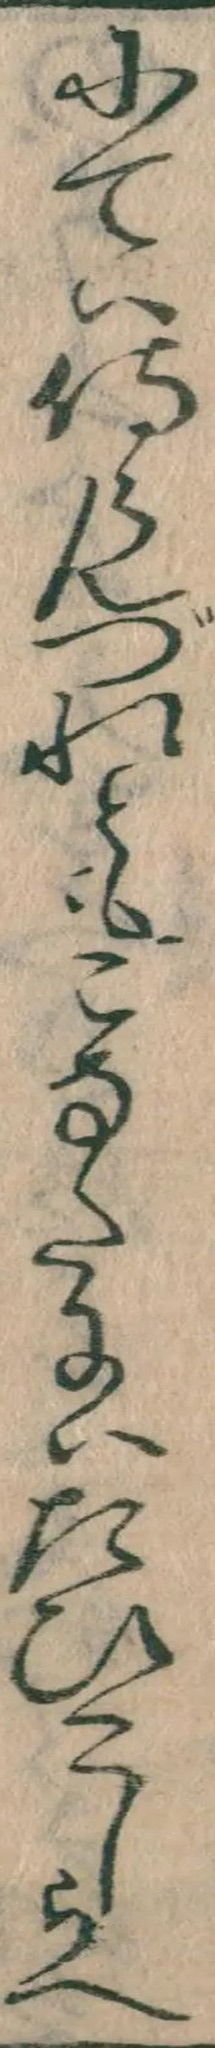にては侍らんづれとも、こなたにはたひこしらへ
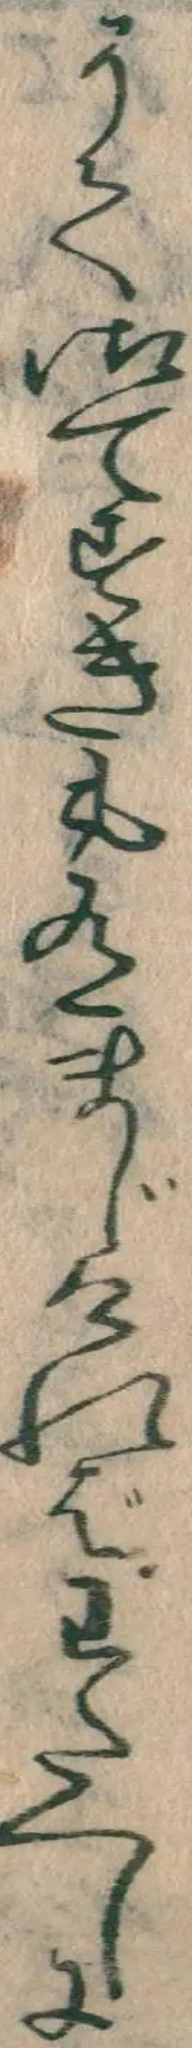にて御てすきも有まじければ、わたくしに
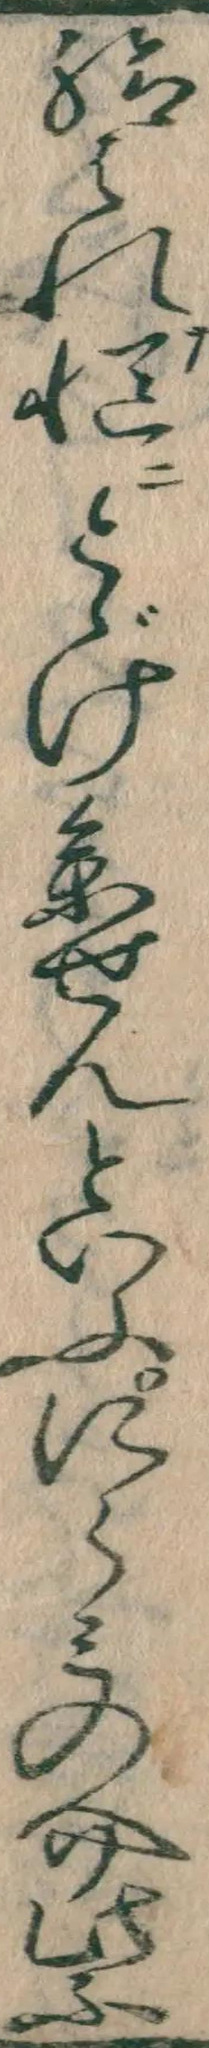給はれ慥とゞけ参せんといふ。にらみの介此ふ
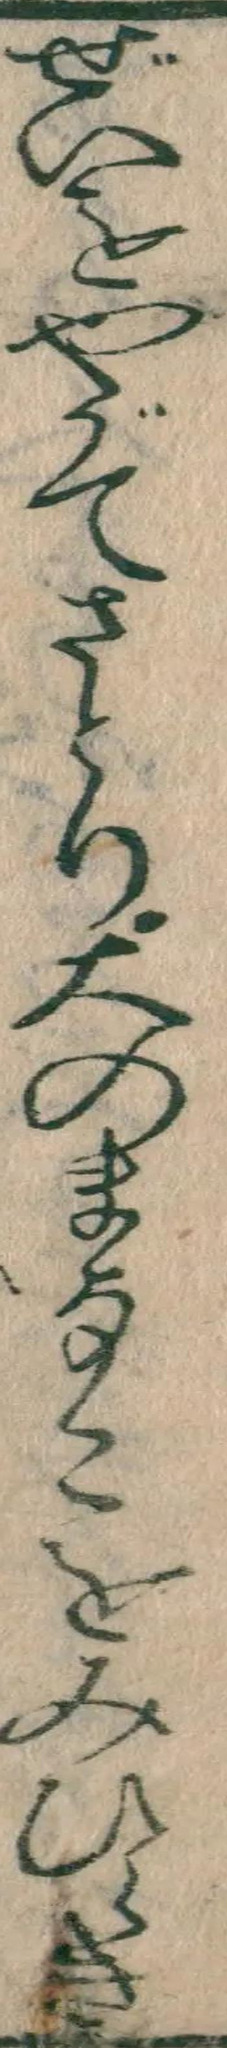ぜいをやがてさとり、大のまなこをみひらき
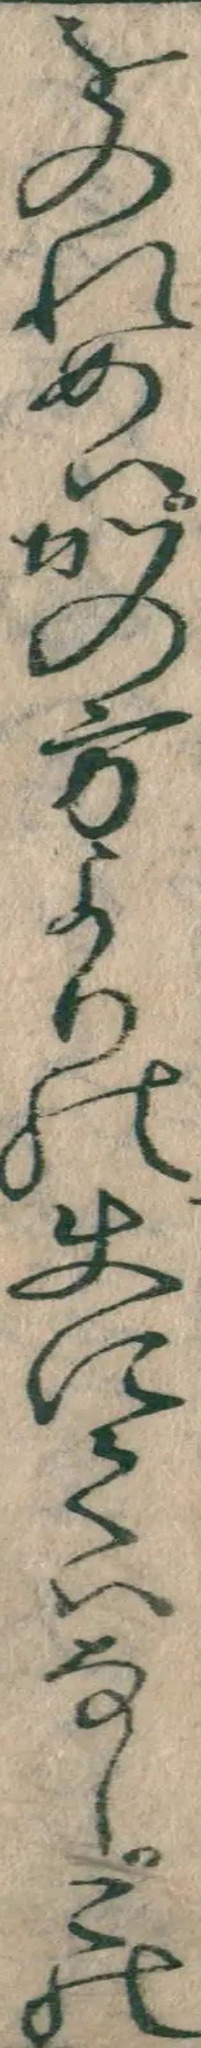をのれめは。かの方よりの使にてはなし。この
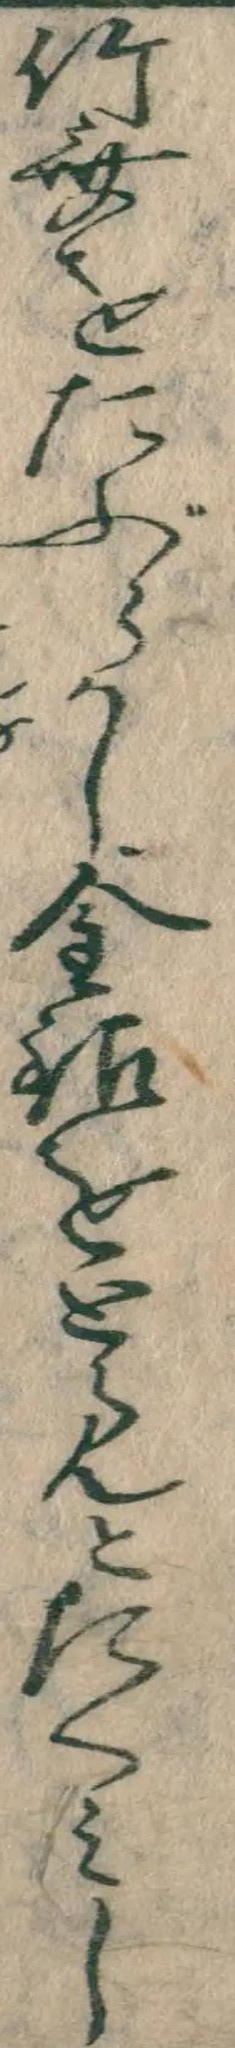竹斎をたぶらかし、金銀をとらんとたくみし
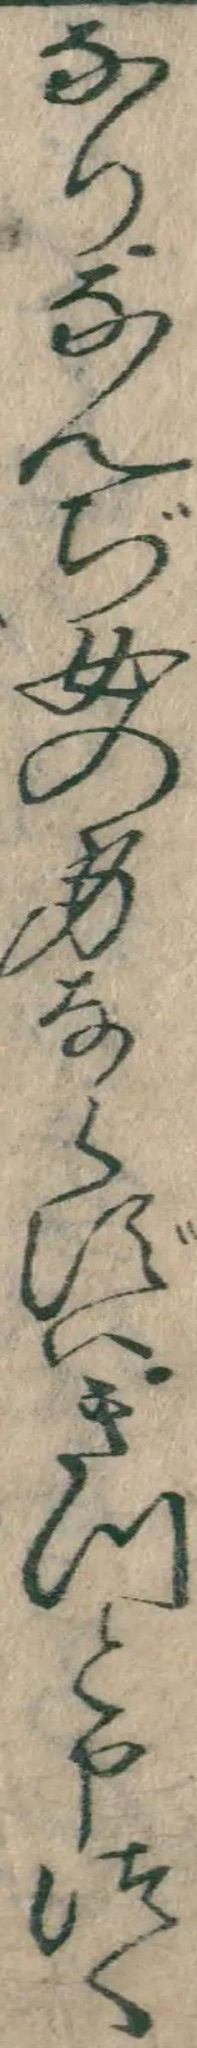なり、なんぢ女の身ならずはきつと申つく
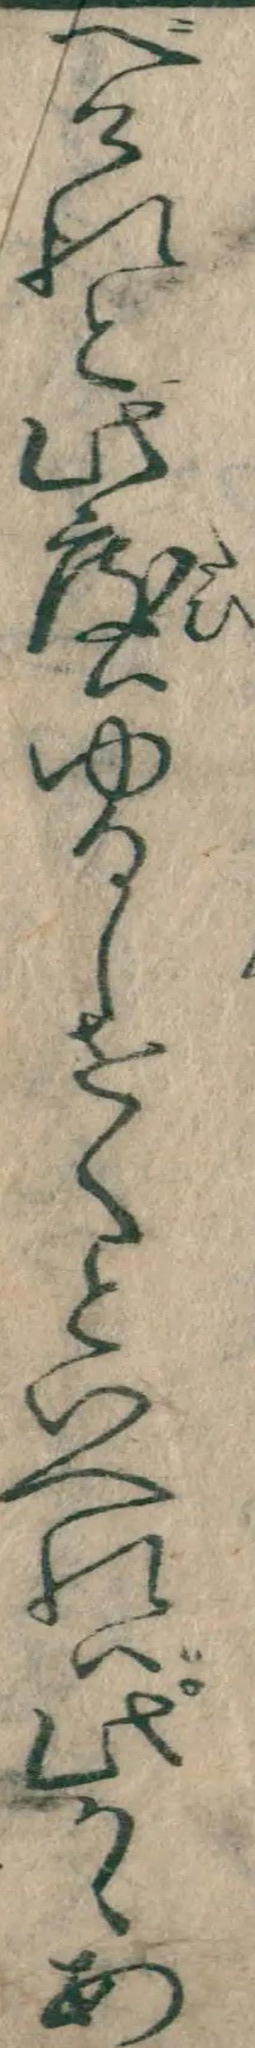べけれと此度はゆるしをくといへれば。此かゝあ

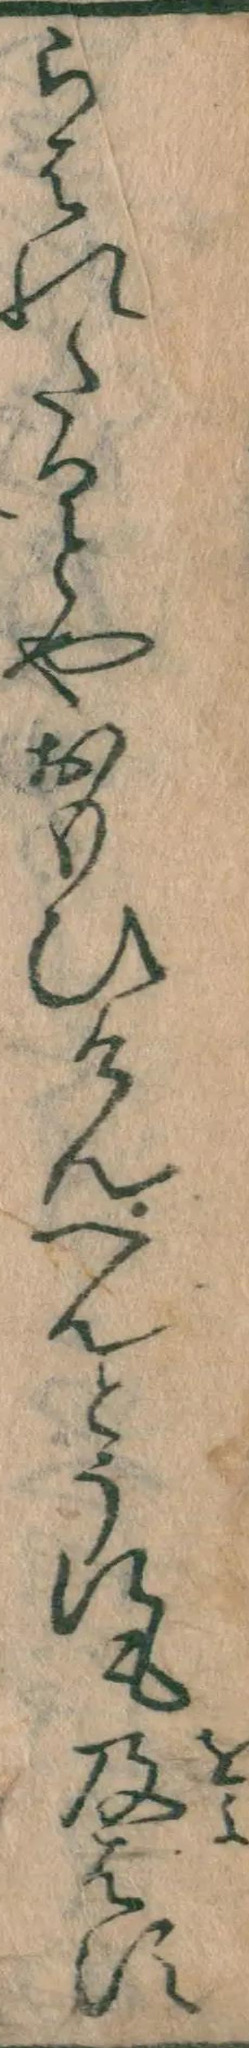らはれたるとやおもひけん、へんとうにも及はす
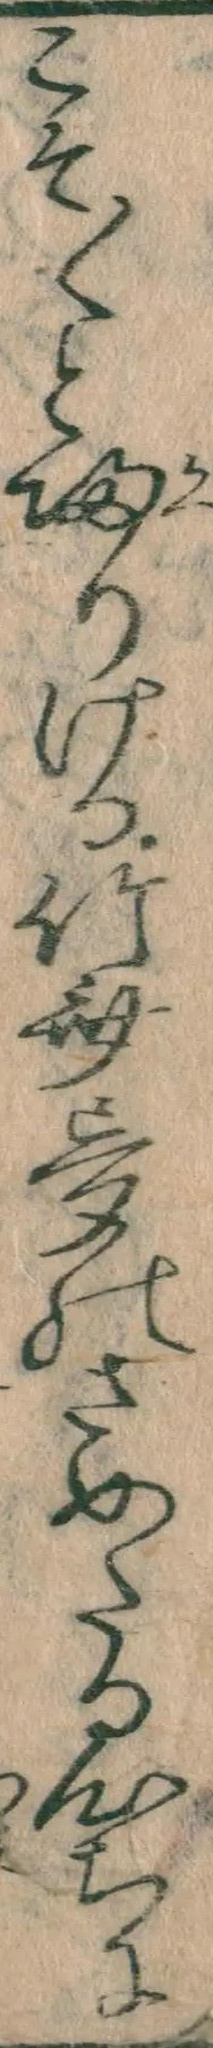こそ〳〵と帰りける、竹斎夢のさめたる心ちに
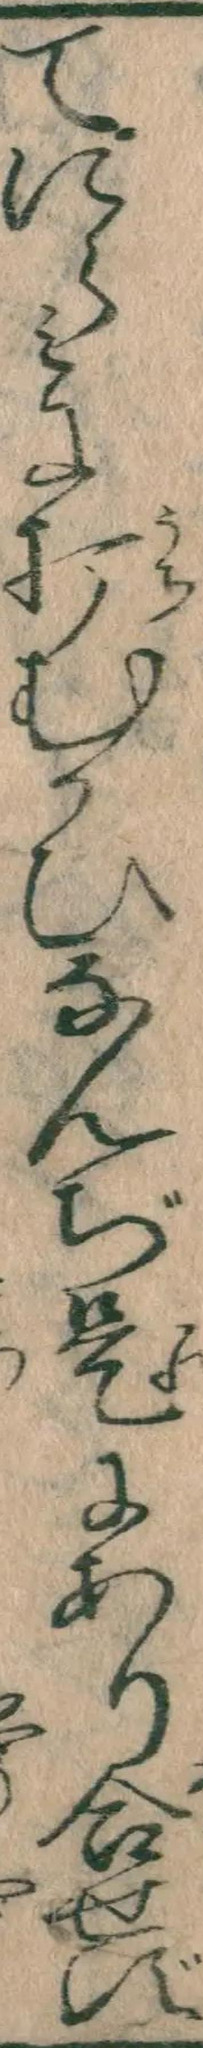て、にらみに打むかひなんぢ是にあり合せず
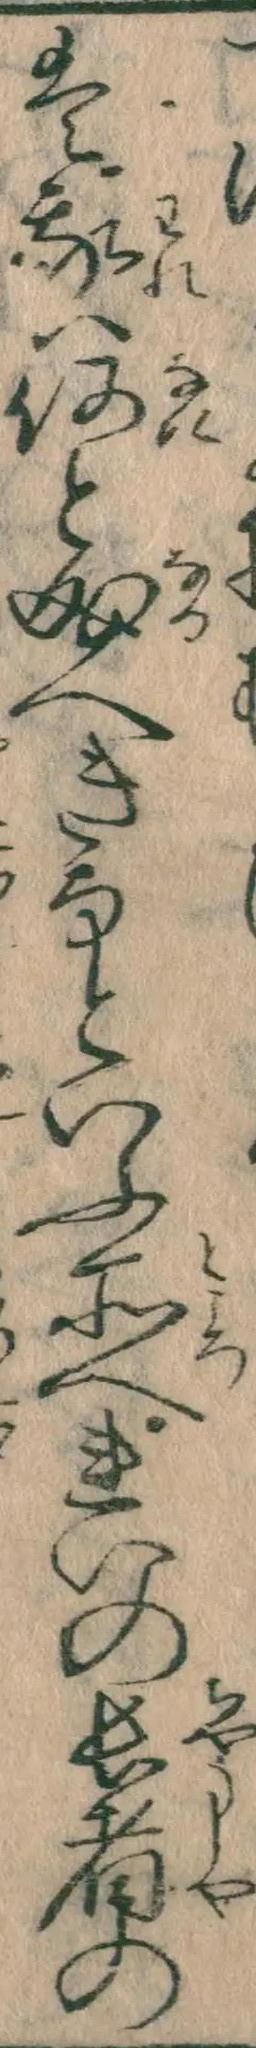は、我は何と成へきなといふ所へ、れいの長者の
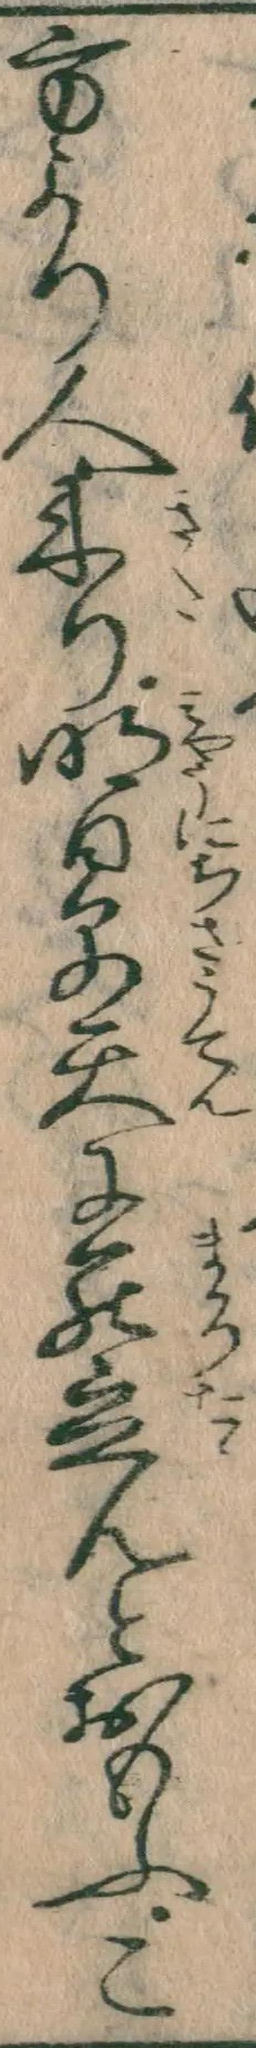方より人来り、明日早天に罷立んとおもふ、こ
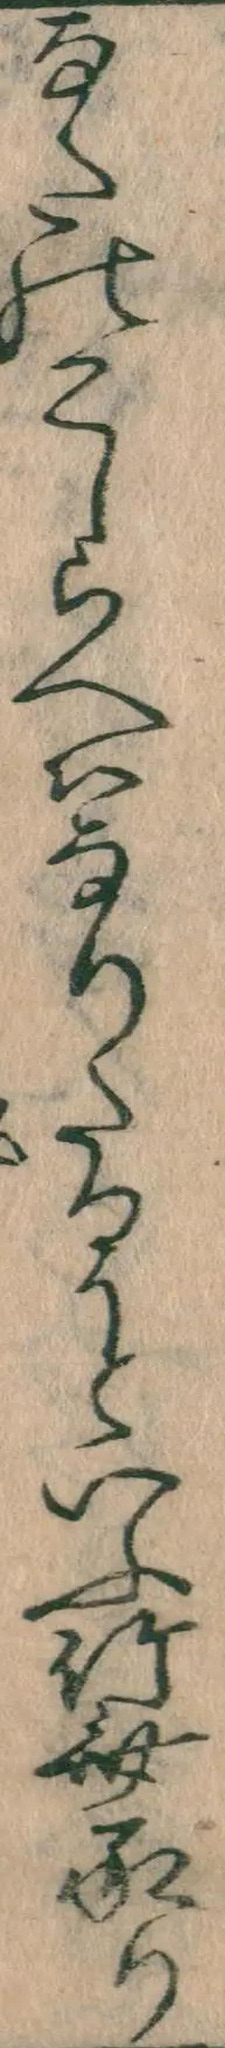なたのこしらへはなりたるかといふ竹斎承り
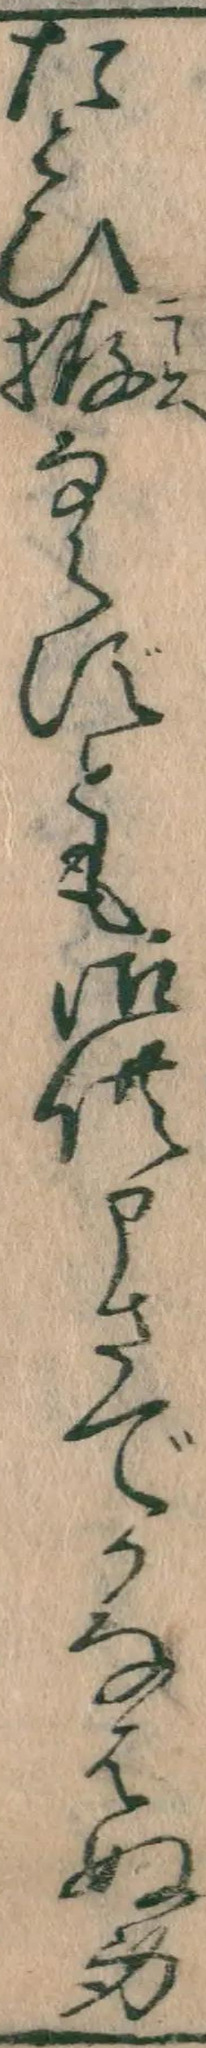たとひ拵ならずとも、御供申さでかなはぬ身
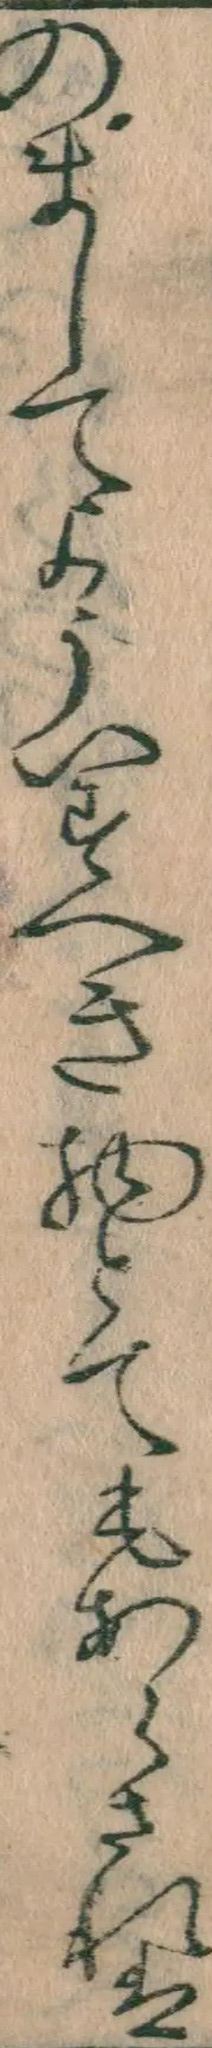の、ましてよういすへき物とてもあらされは
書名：竹斎狂歌物語 3巻
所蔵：国立国会図書館 National Diet Library, JAPAN
